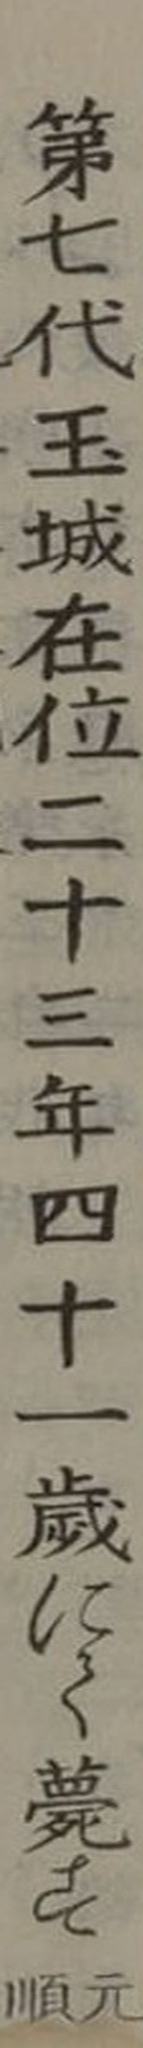第七代玉城在位二十三年四十一歳にて薨す元順
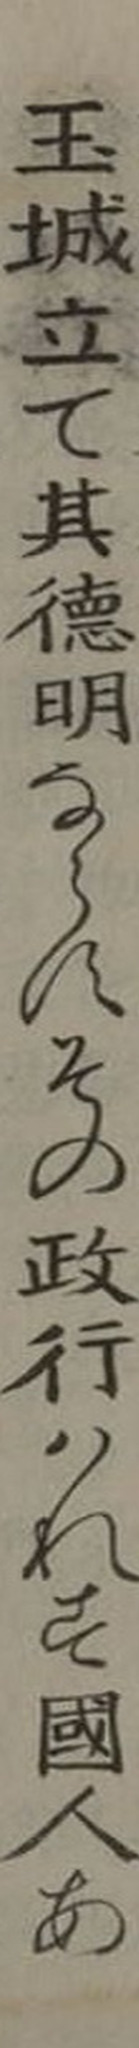玉城立て其德明ならすその政行はれす國人あ
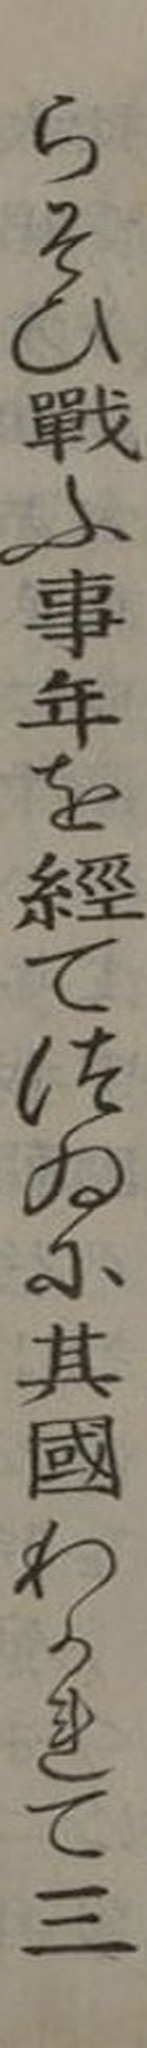らそひ戰ふ事年を經てつゐに其國わかれて三
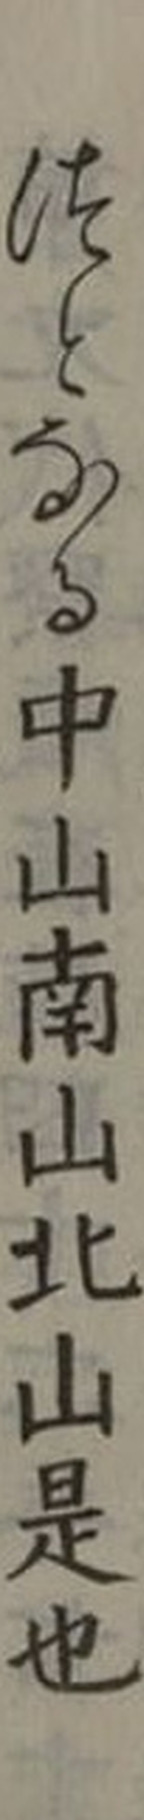つとなる中山南山北山是也
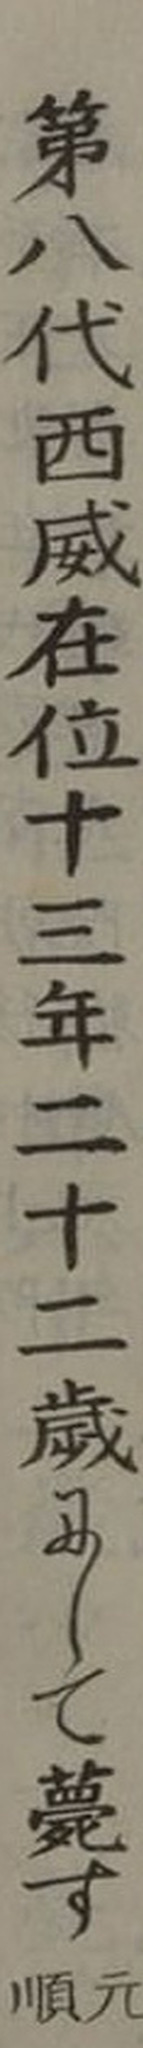第八代西威在位十三年二十二歲にして薨す元順

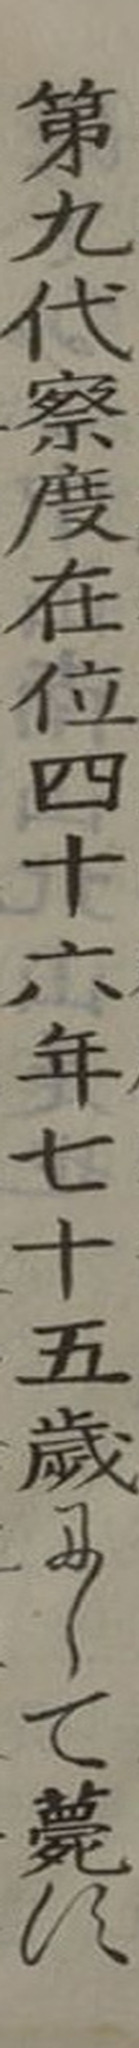第九代察度在位四十六年七十五歳にして薨す
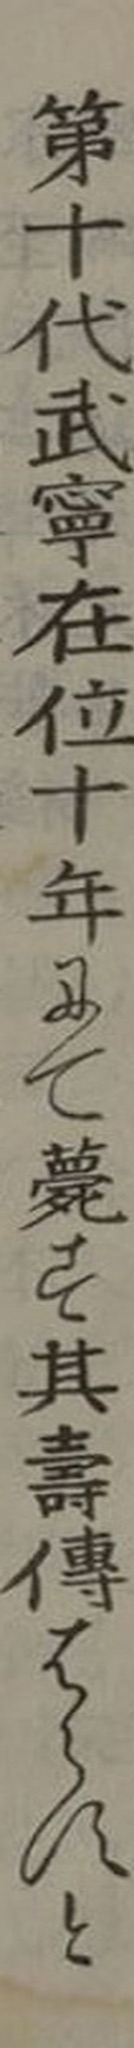第十代武寧在位十年にて薨す其壽傳はらすと
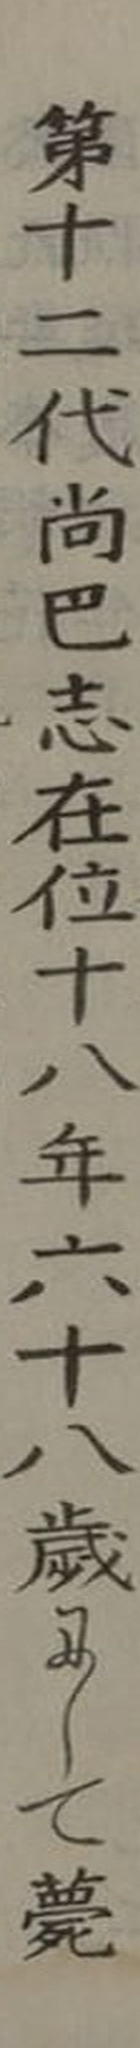第十二代尚巴志在位十八年六十八歳にして薨
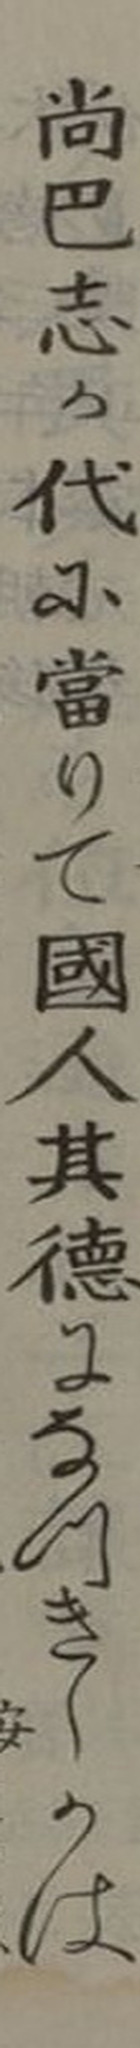尚巴志か代に當りて國人其德になつきしかは
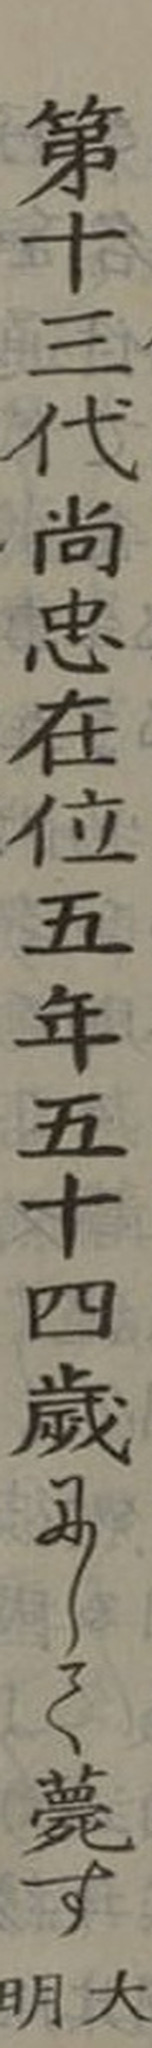第十三代尚忠在位五年五十四歳にして薨す大明
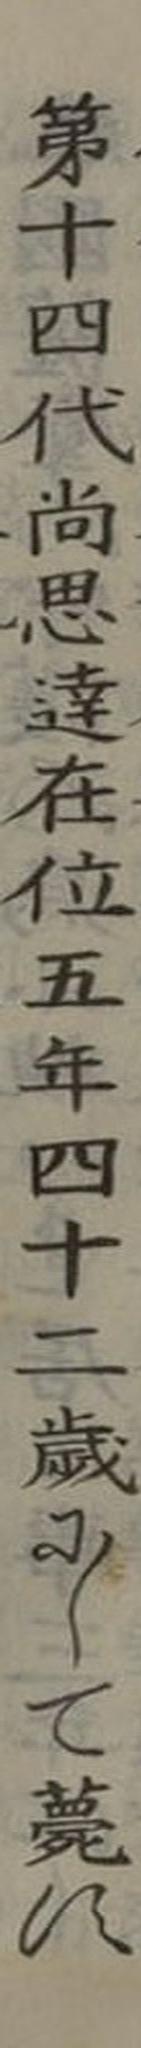第十四代尚思達在位五年四十二歳にして薨す
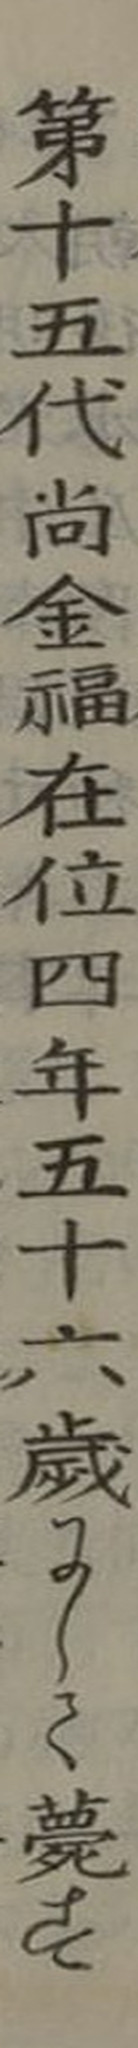第十五代尚金福在位四年五十六歳にして薨す
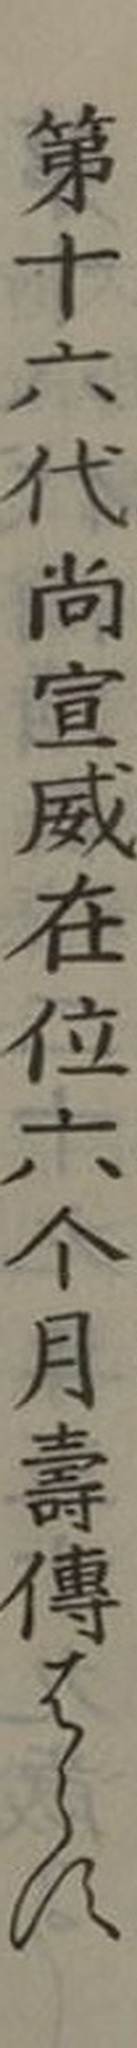第十六代尚宣威在位六个月壽傳はらす
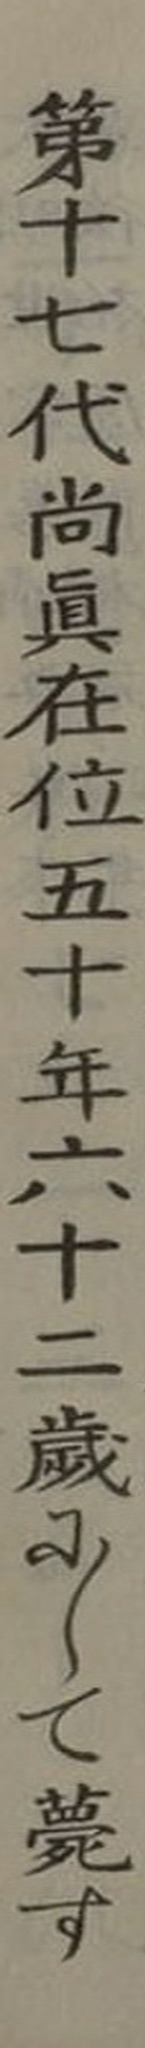第十七代尚眞在位五十年六十二歳にして薨す

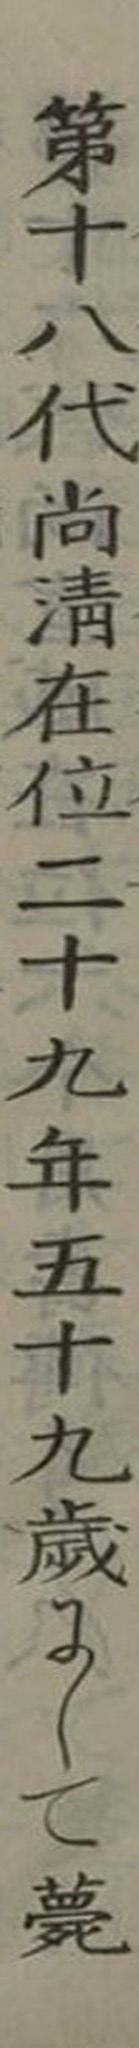第十八代尚清在位二十九年五十九歳にして薨
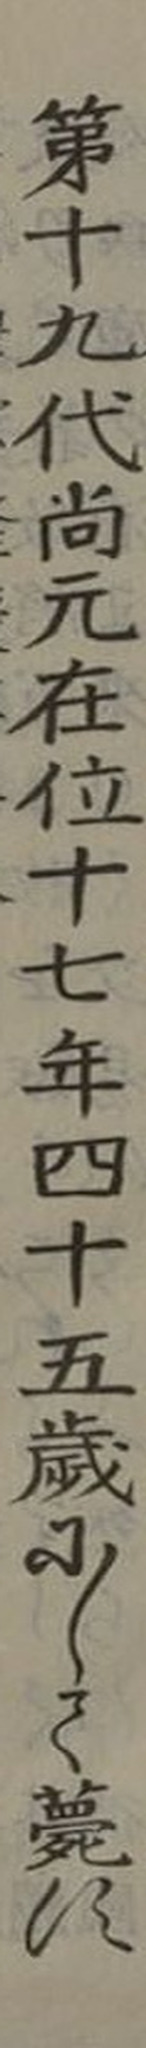第十九代尚元在位十七年四十五歳にして薨す
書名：骨董録
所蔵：University of the Ryukyus Library
